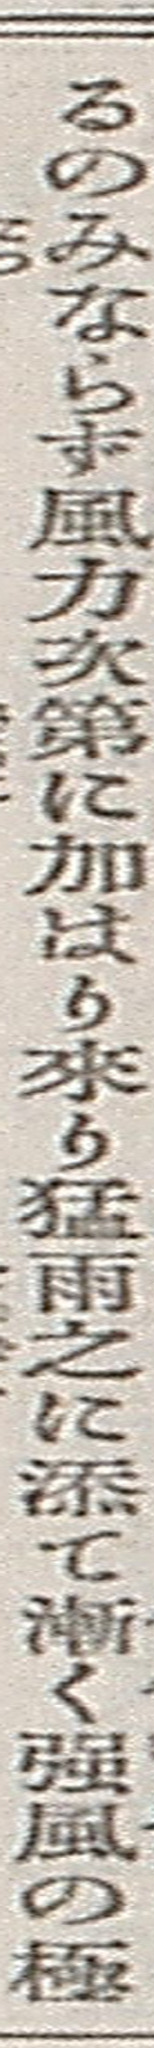るのみならず風力次第に加はり来り猛雨之に添て漸く強風の極
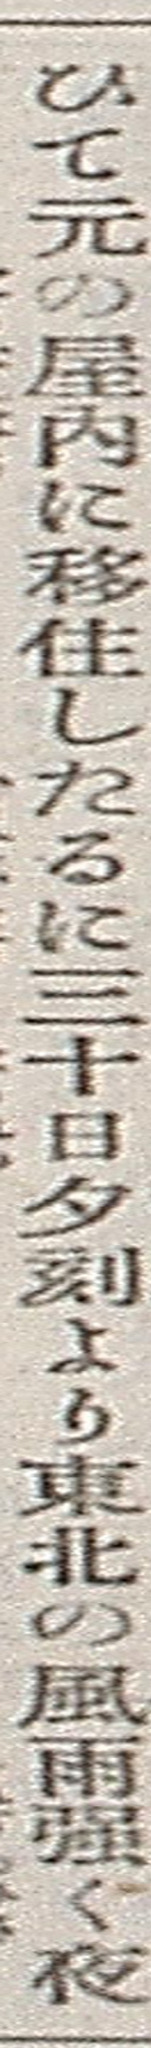ひて元の屋内に移住したるに三十日夕刻より東北の風雨強く夜
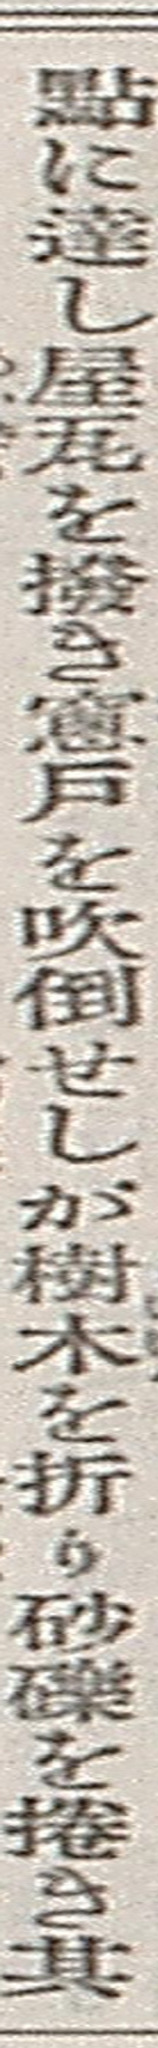点に達し屋瓦を撥き窻戸を吹倒せしが樹木を折り砂礫を捲き其
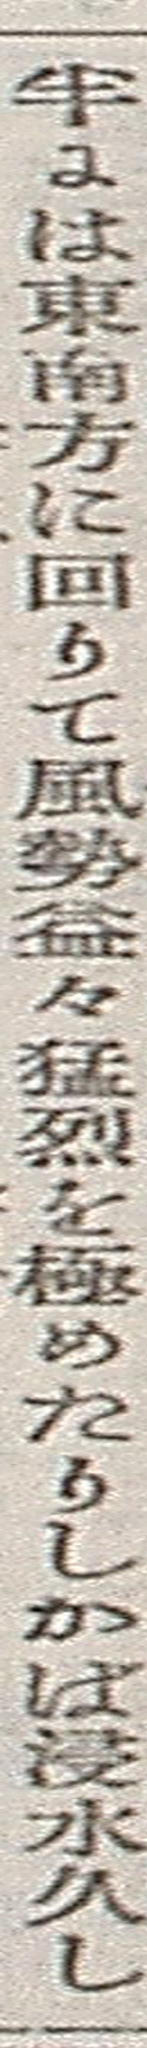半には東南方に回りて風勢益々猛烈を極めたりしかば浸水久し
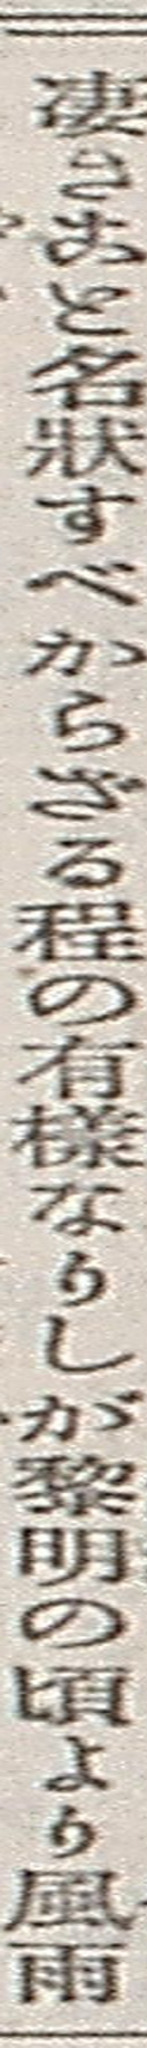凄きこと名状すべからざる程の有様なりしが黎明の頃より風雨
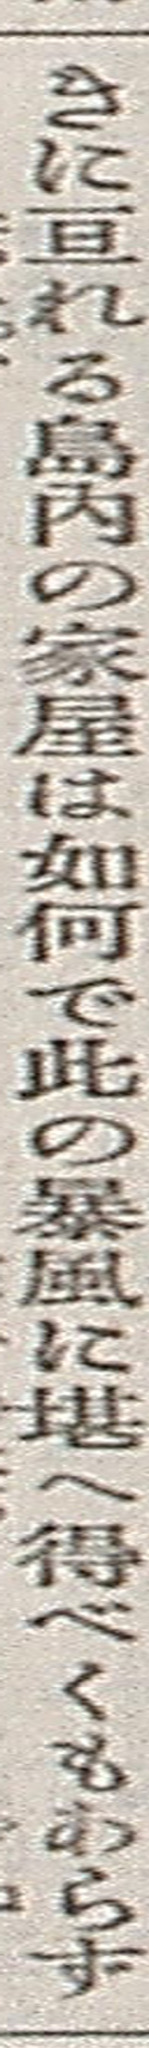きに亘れる島内の家屋は如何で此の暴風に堪え得べくもあらず
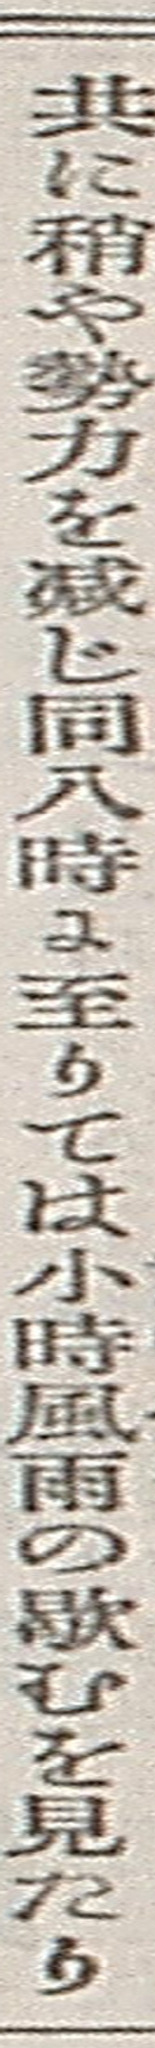共に稍や勢力を減じ同八時に至りては小時風雨の歇むを見たり
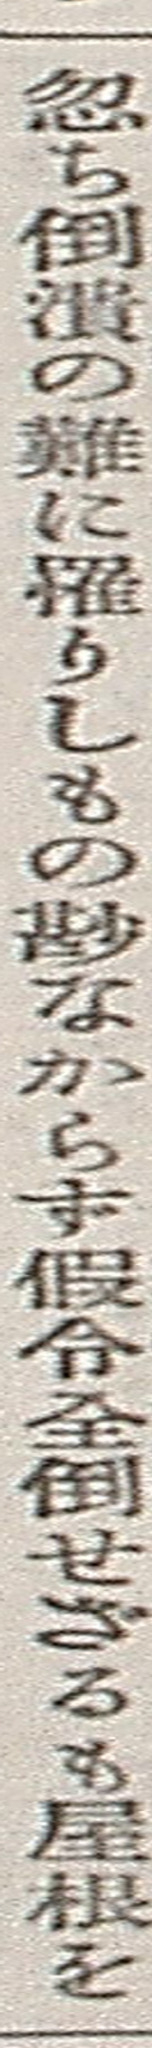忽ち倒潰の難に罹りしもの尠なからず仮令全倒せざるも屋根を

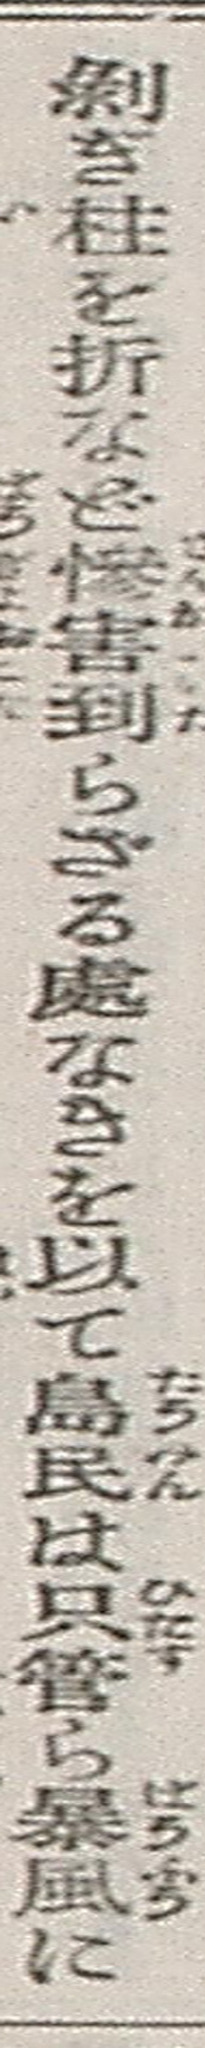剥ぎ柱を折など惨害到らざる処なきを以て島民は只管ら暴風に
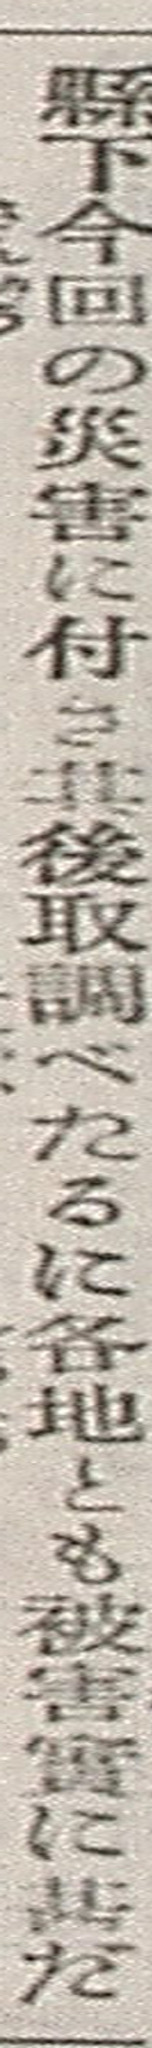県下今回の災害に付き其後取調べたるに各地とも被害実に甚だ
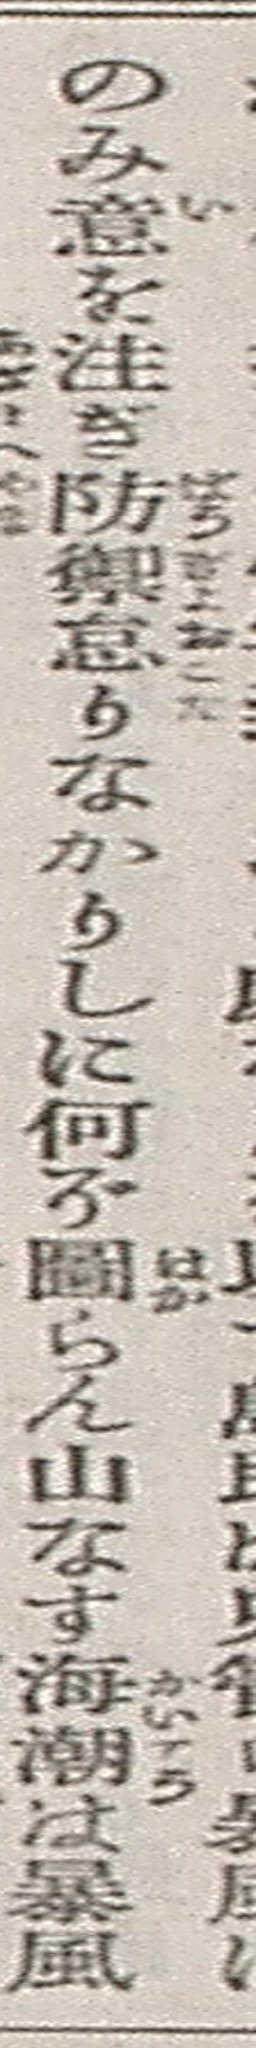のみ意を注ぎ防禦怠りなかりしに何に図らん山なす海潮は暴風
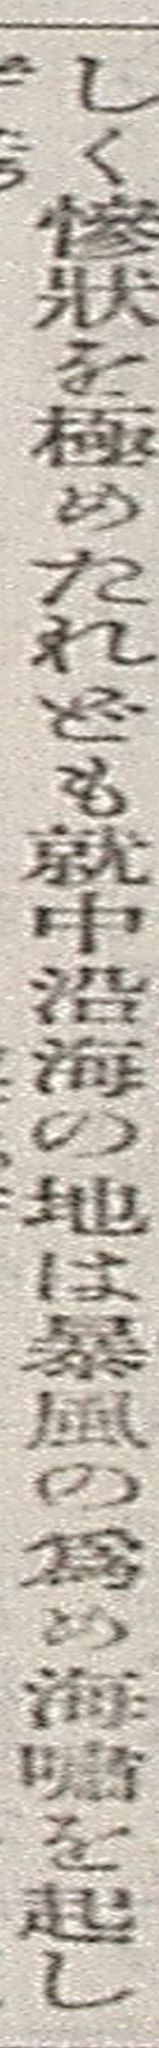しく惨状を極めたれども就中沿海の地は暴風の為め海嘯を起し
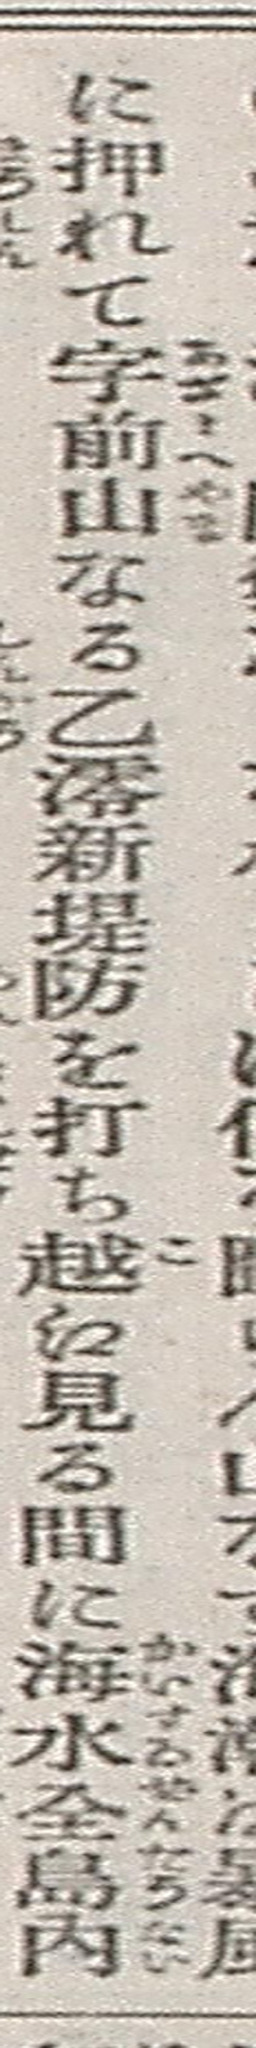に押れて字前山なる乙澪新堤防を打ち越え見る間に海水全島内
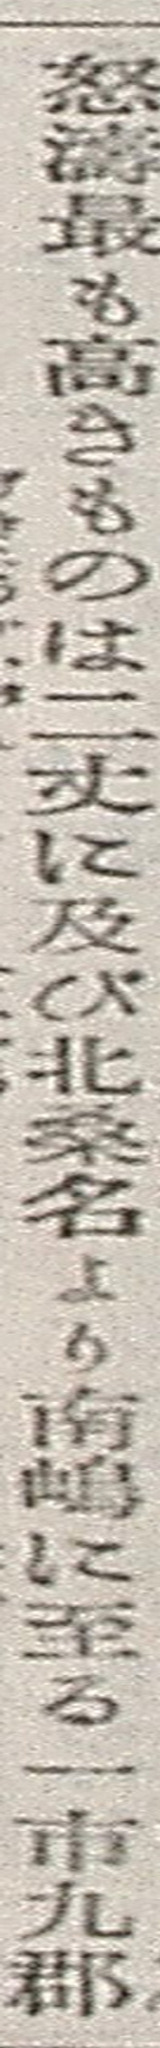怒濤最も高きものは二丈に及び北桑名より南嶋に至る一市九郡
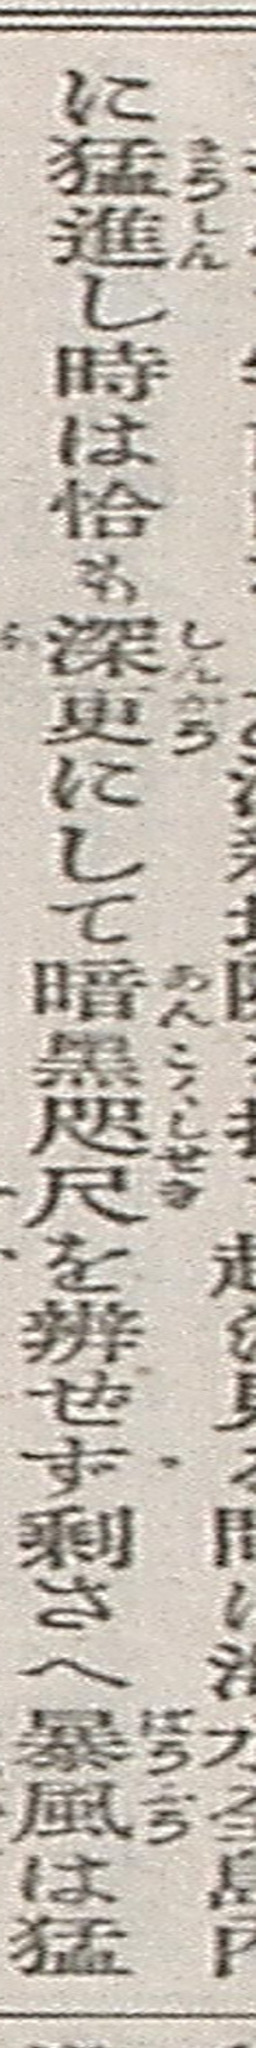に猛進し時は恰も深更にして暗黒咫尺を辨ぜず剰さへ暴風は猛
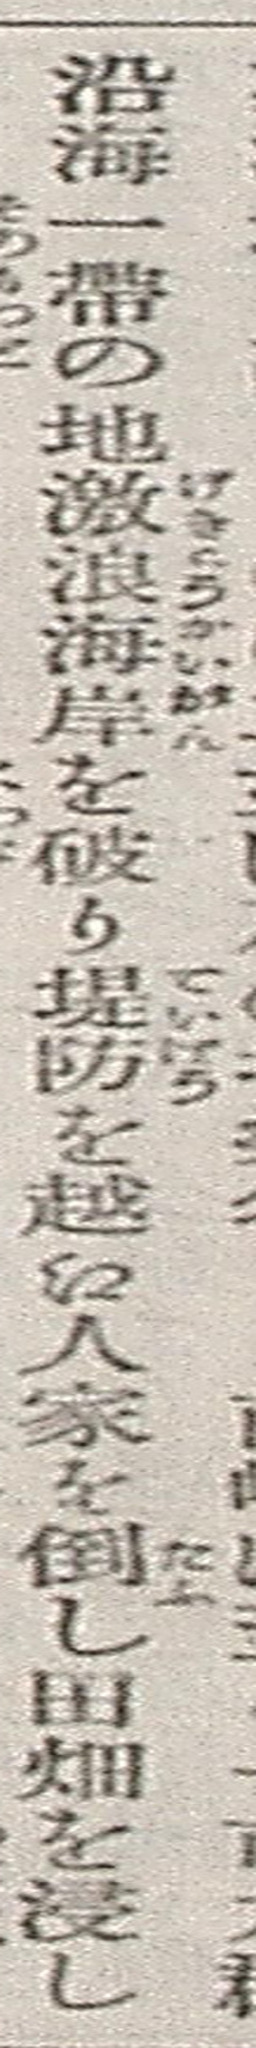沿海一帯の地激浪海岸を破り堤防を越え人家を倒し田畑を浸し
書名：風俗畫報臨時増刊第百二十八號　洪水被害録（下）
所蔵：東京大学地震研究所図書室 Earthquake Research Institute Library, The University of Tokyo, JAPAN
